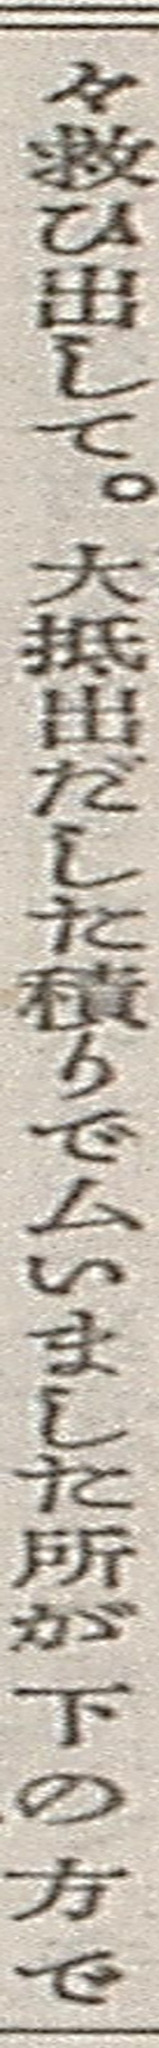々救ひ出して。大抵出だした積りで厶いました所が下の方で
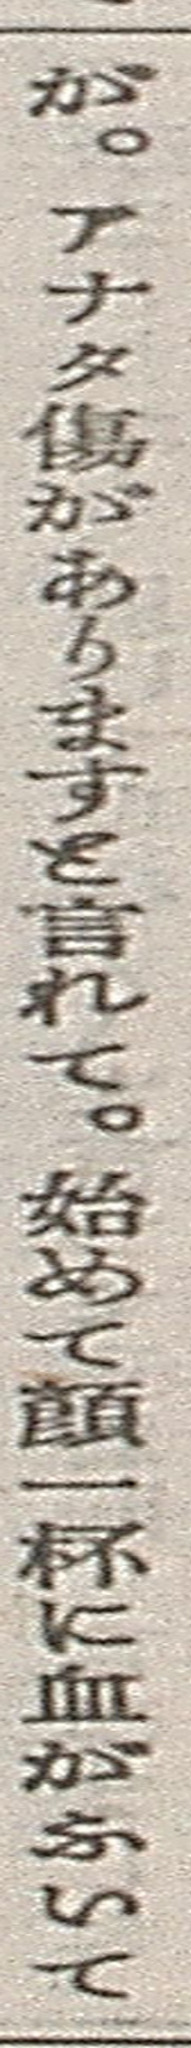が。アナタ傷がありますと言れて。始めて顔一杯に血がふいて
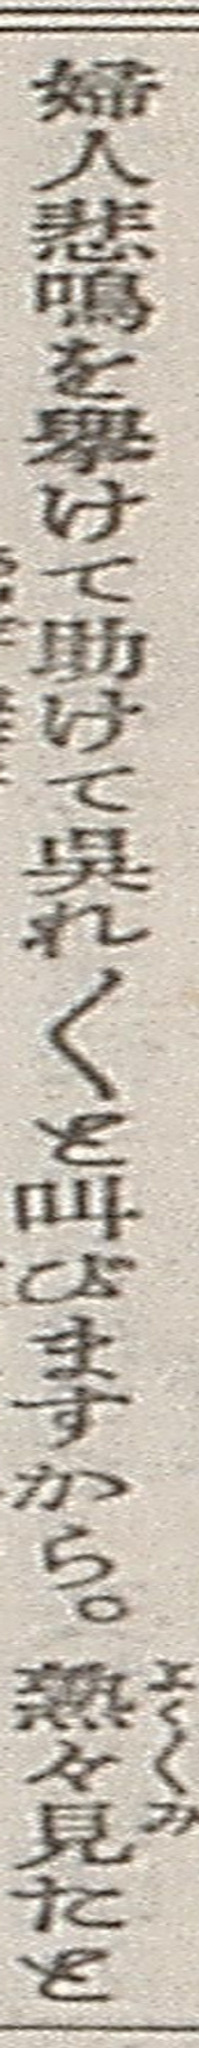婦人悲鳴を挙けて助けて呉れ〳〵と叫びますから。熟々見たと
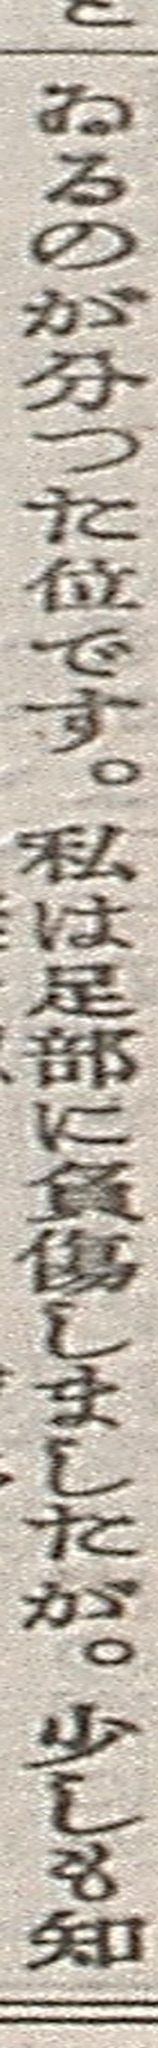ゐるのが分つた位です。私は足部に負傷しましたが。少しも知
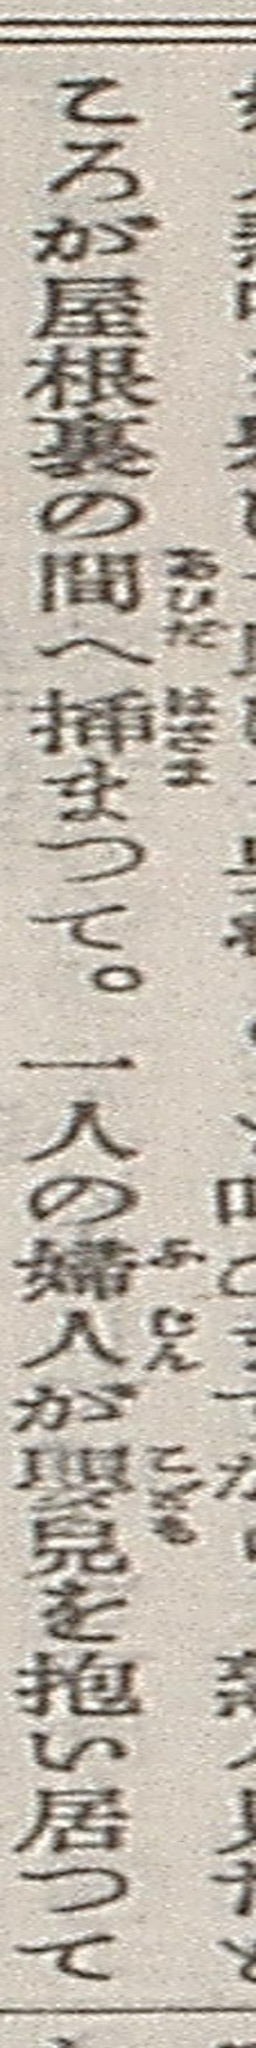ころが屋根裏の間へ挿まつて。一人の婦人が嬰児を抱い居つて
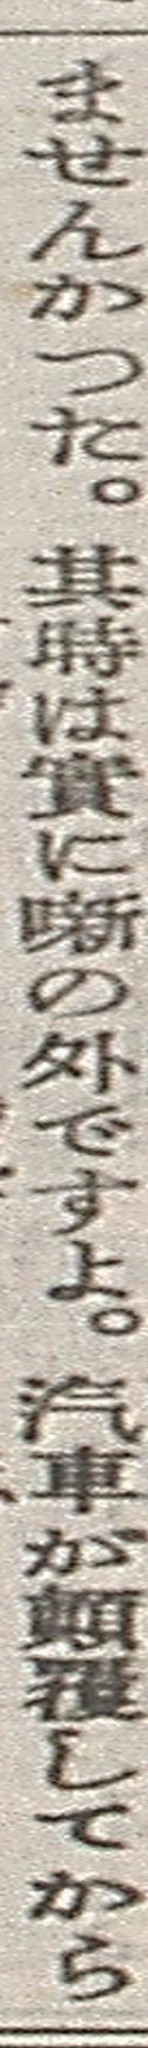ませんかつた。其時は実に噺の外ですよ。汽車が顛覆してから
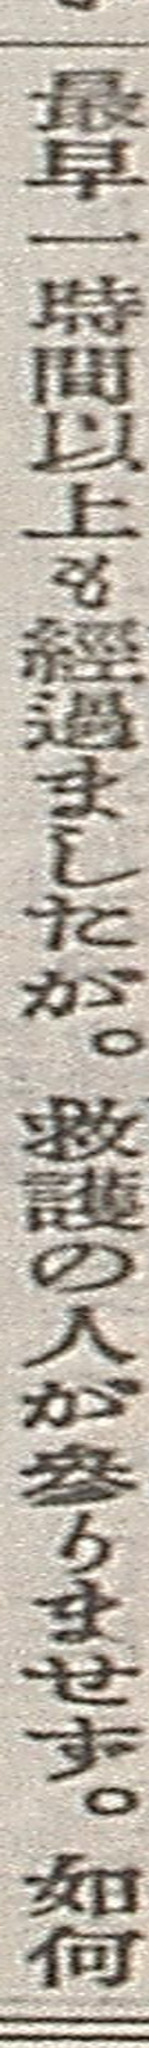最早一時間以上も経過ましたが。救護の人が参りませず。如何
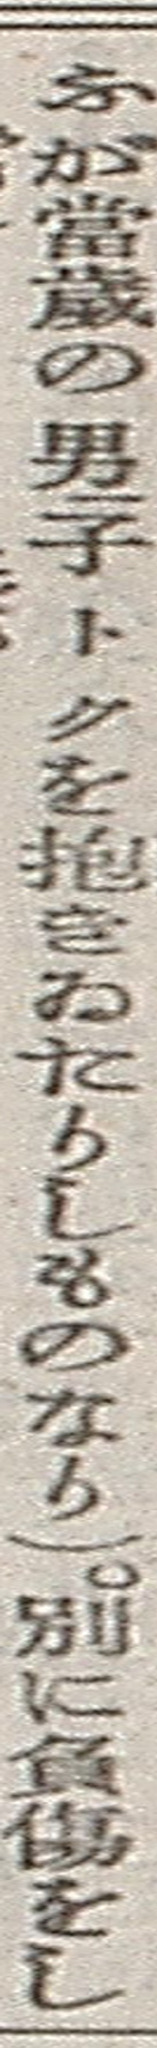ふが当歳の男子トクを抱きゐたりしものなり）。別に負傷をし
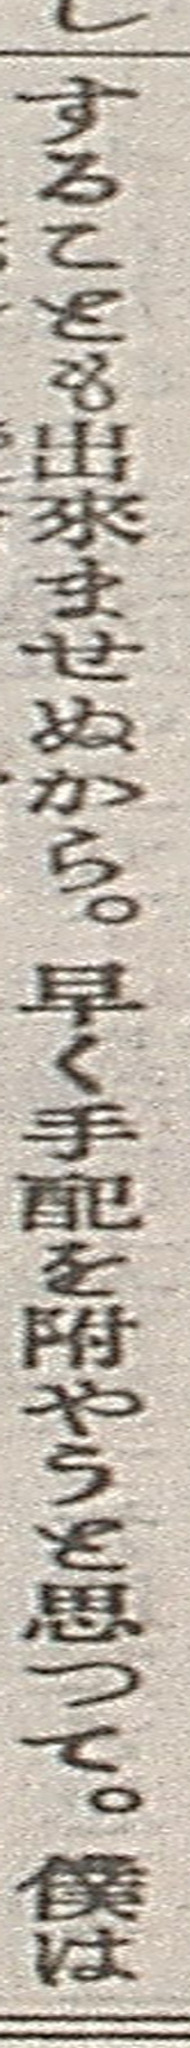することも出来ませぬから。早く手配を付やうと思つて。僕は
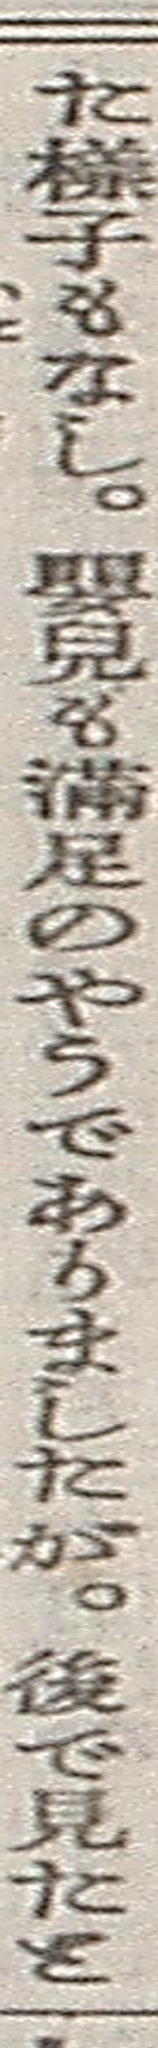た様子もなし。嬰児も満足のやうでありましたが。後で見たと
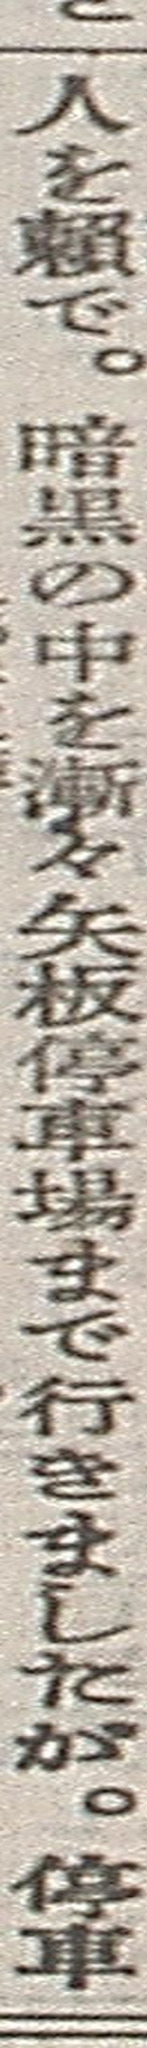人を頼で。暗黒の中を漸々矢板停車場まで行きましたが。停車
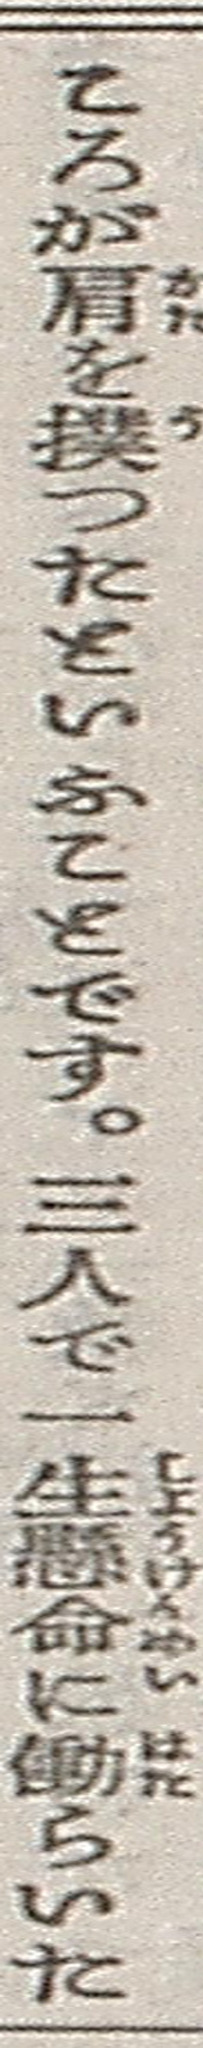ころが肩を撲つたといふことです。三人で一生懸命に働らいた
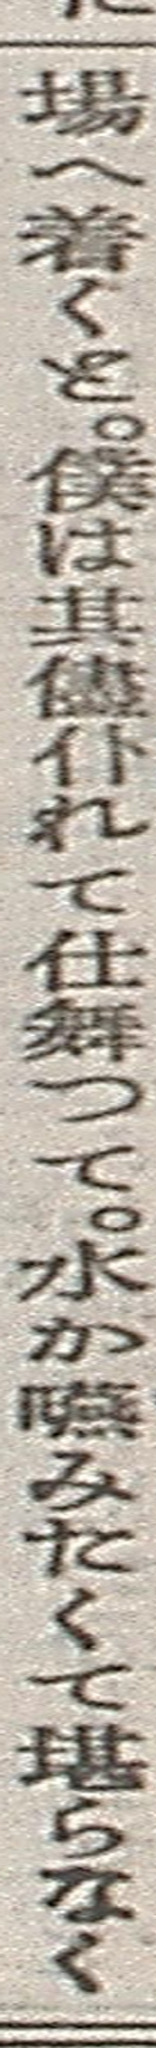場へ着くと。僕は其侭仆れて仕舞つて。水か嚥みたくて堪らなく
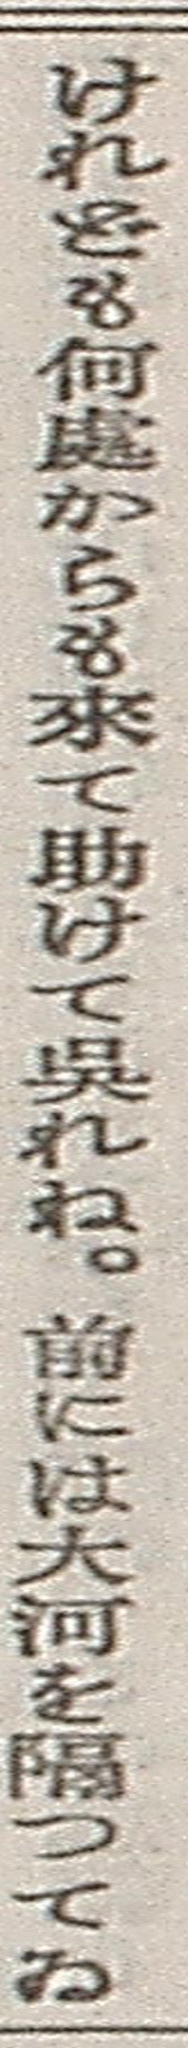けれども何処からも来て助けて呉れね。前には大河を隔つてゐ
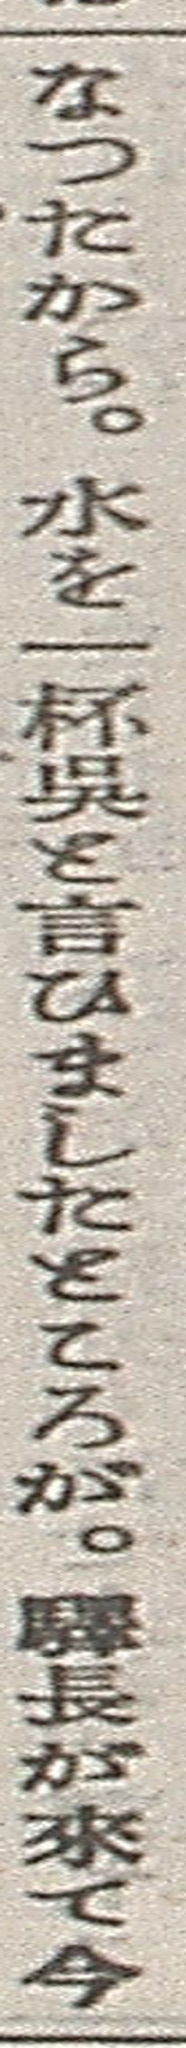なつたから。水を一杯呉と言ひましたところが。駅長が来て今
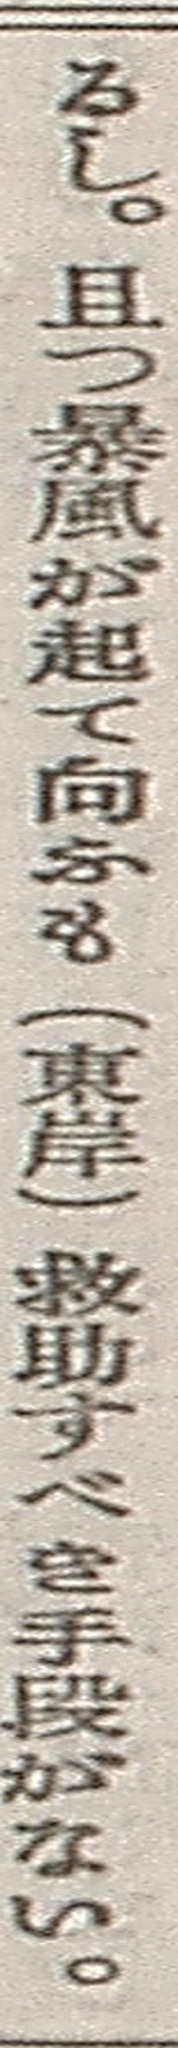るし。且つ暴風が起て向ふも救助すべき手段がない。
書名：風俗畫報臨時増刊第百九十九號　明治三十二年十月各地災害圖會（前編之續）
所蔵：東京大学地震研究所図書室 Earthquake Research Institute Library, The University of Tokyo, JAPAN
